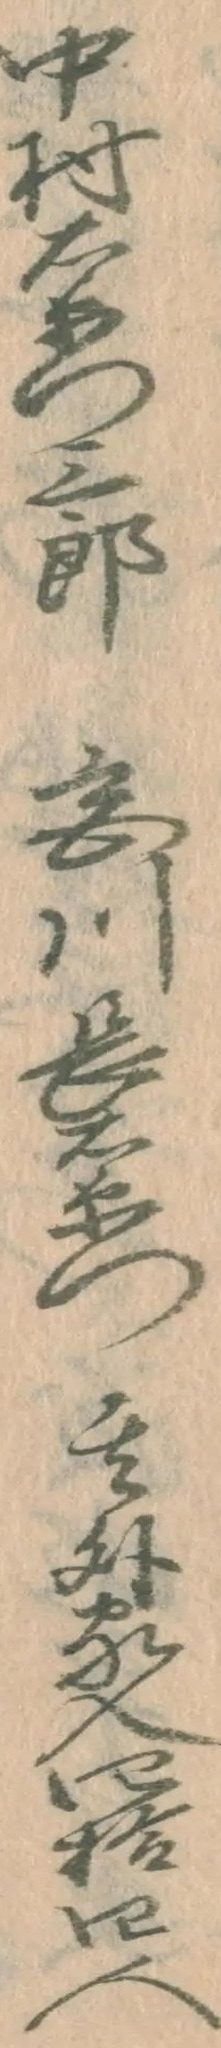中村右衛門三郎宮川長右衛門其外家人四拾四人
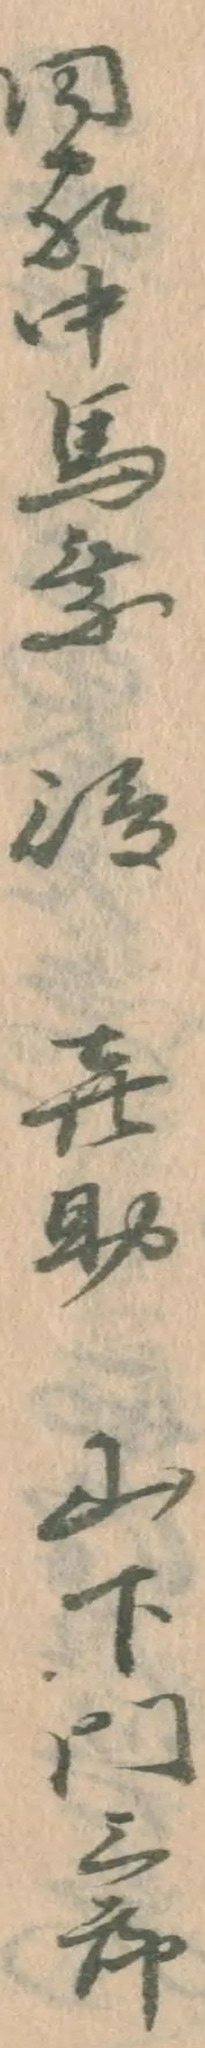同家中馬乗島喜助山下門三郎
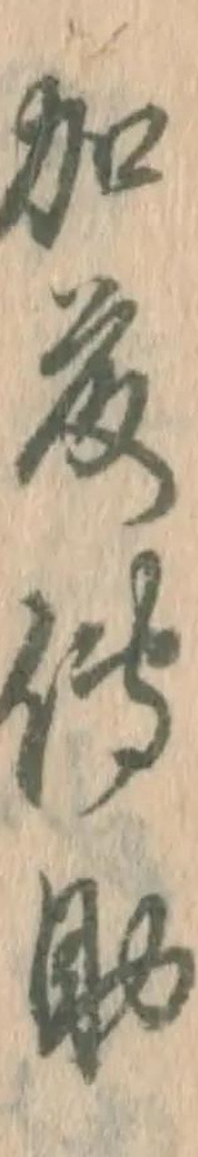加藤伝助
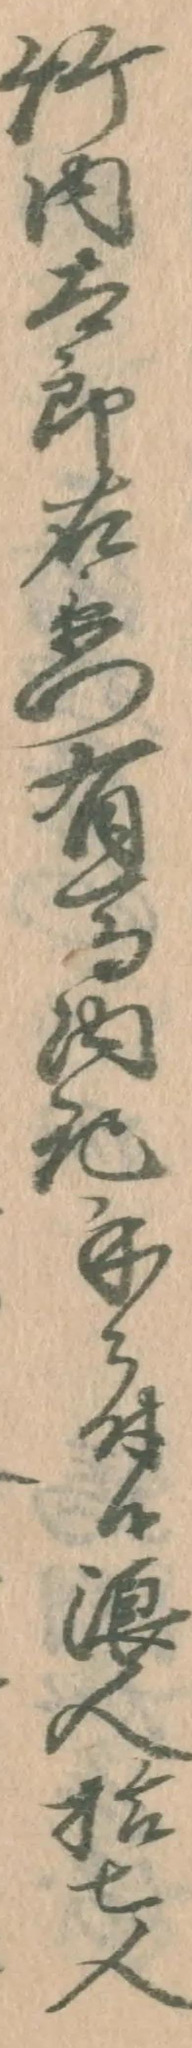竹内太郎右衛門有馬内記手に付候浪人拾七人
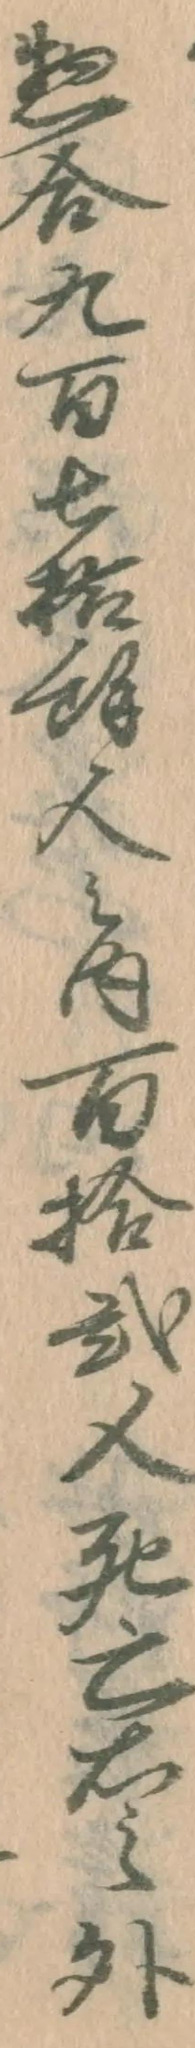惣合九百七拾余人之内百拾弐人死亡右之外
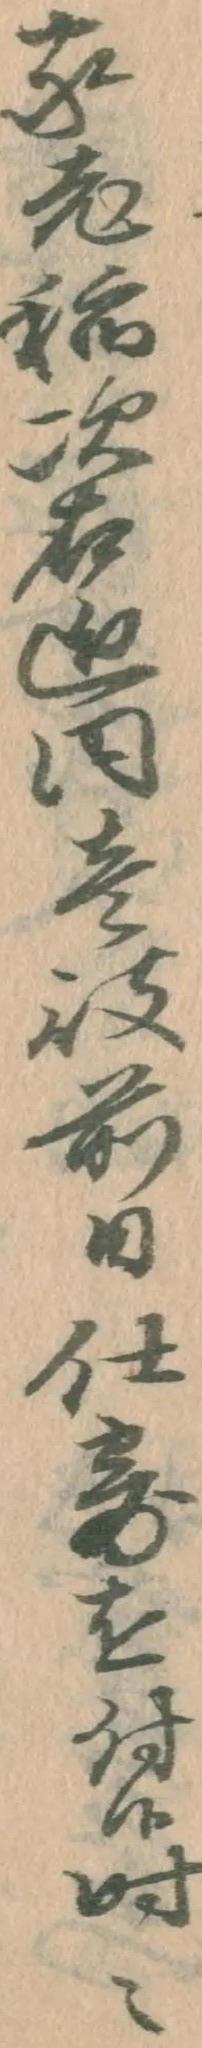家老稲次右近同壱岐前日仕寄を付候時之
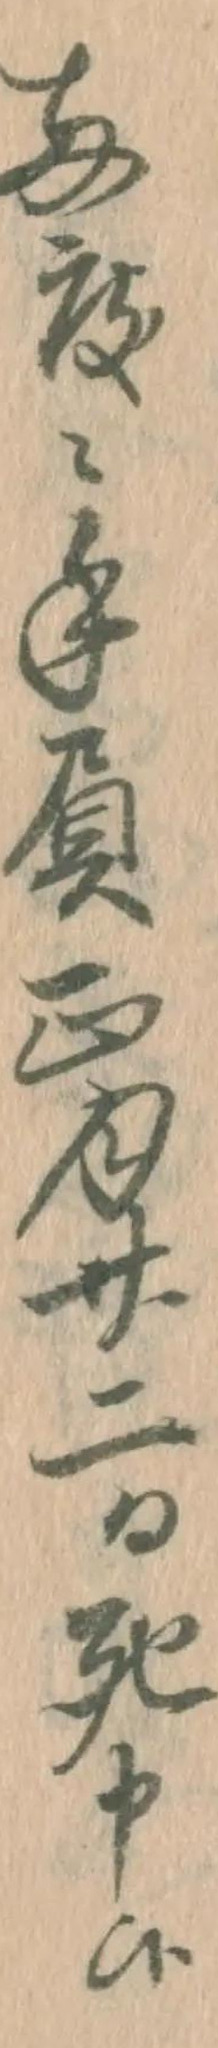両度に手負正月廿二日死申候
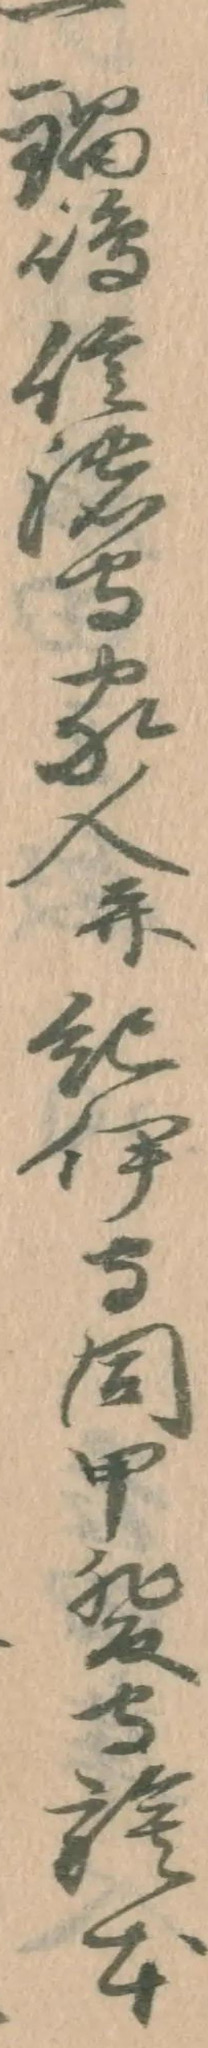一鍋島信濃守家人幷紀伊守同甲斐守旗本
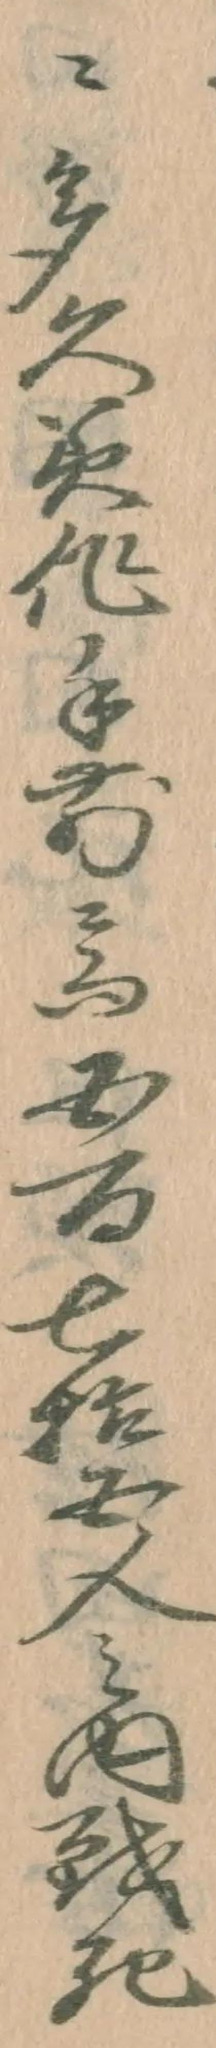に多久美作手前に而五百七拾五人之内戦死
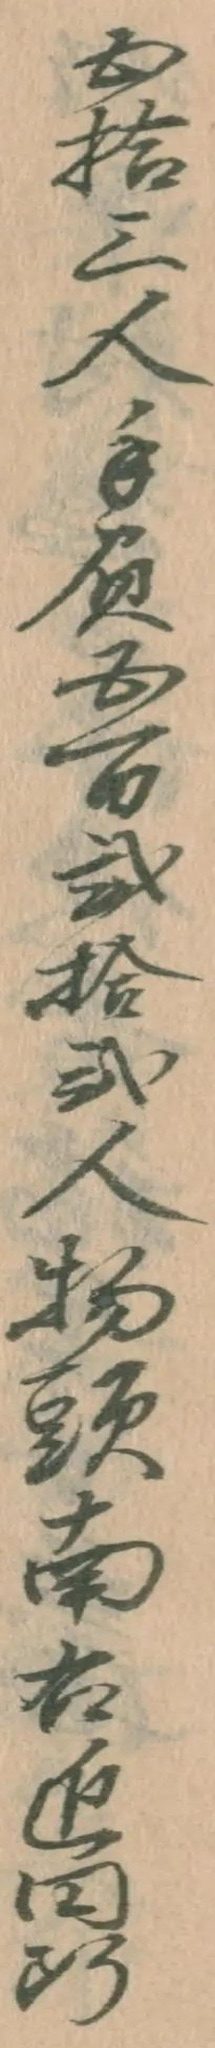五拾三人手負五百弐拾弐人物頭南右近同断
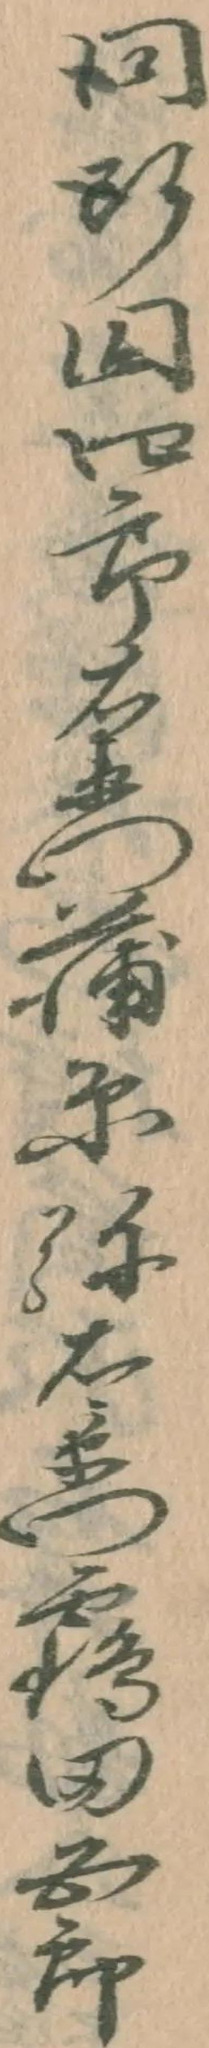同断同四郎右衛門蒲原弥右衛門露田五郎
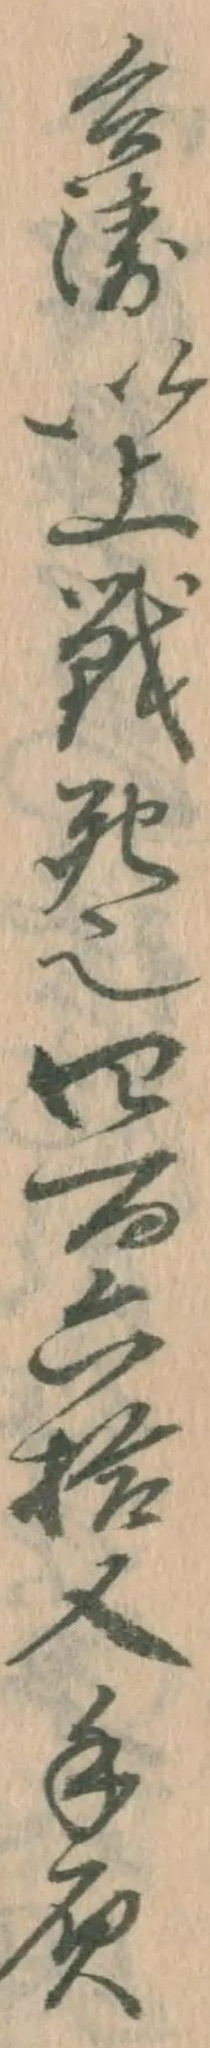兵衛以上戦死也四百六拾人手負
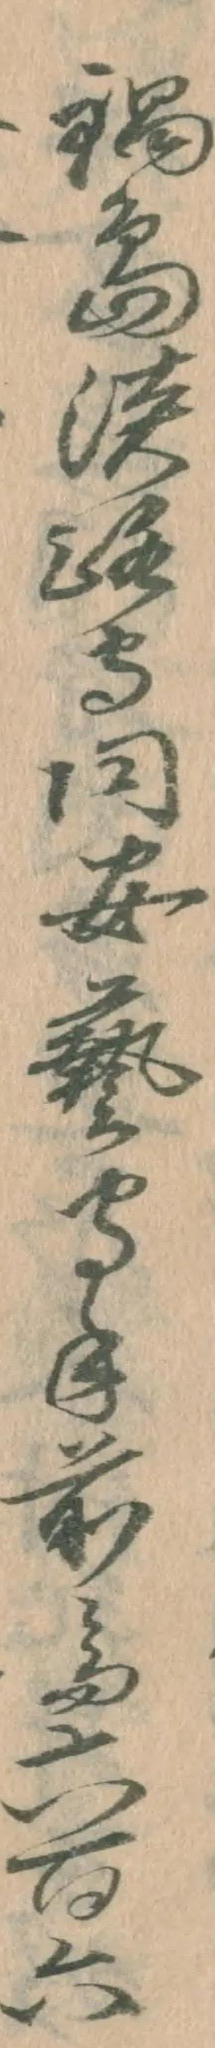一鍋島淡路守同安芸守手前に而六百六
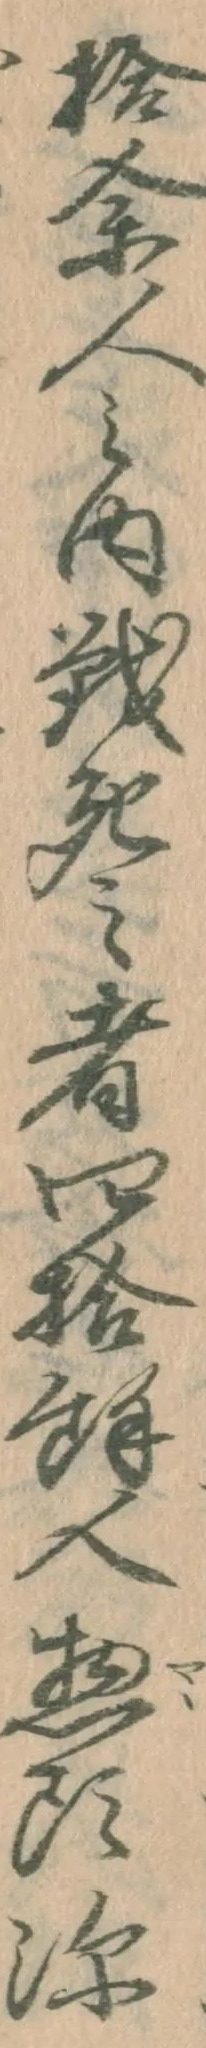拾余人之内戦死之者四拾余人惣頭深
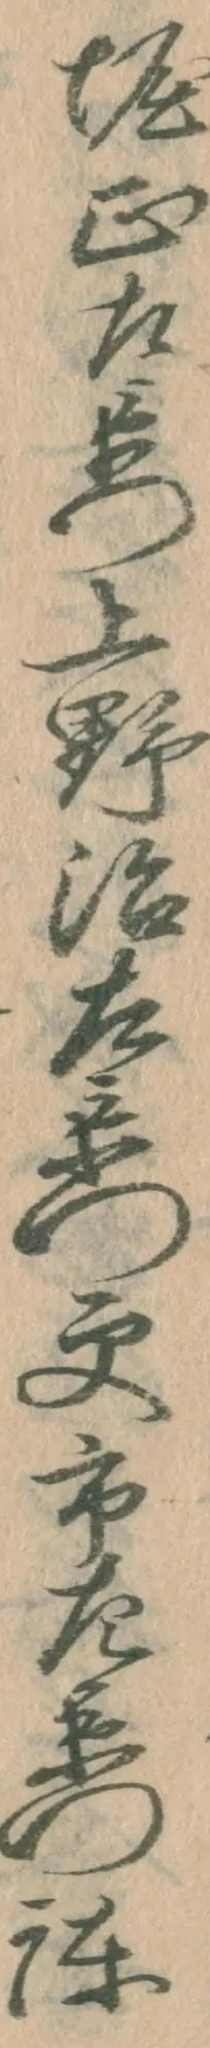堀正左衛門上野治左衛門更市左衛門諌
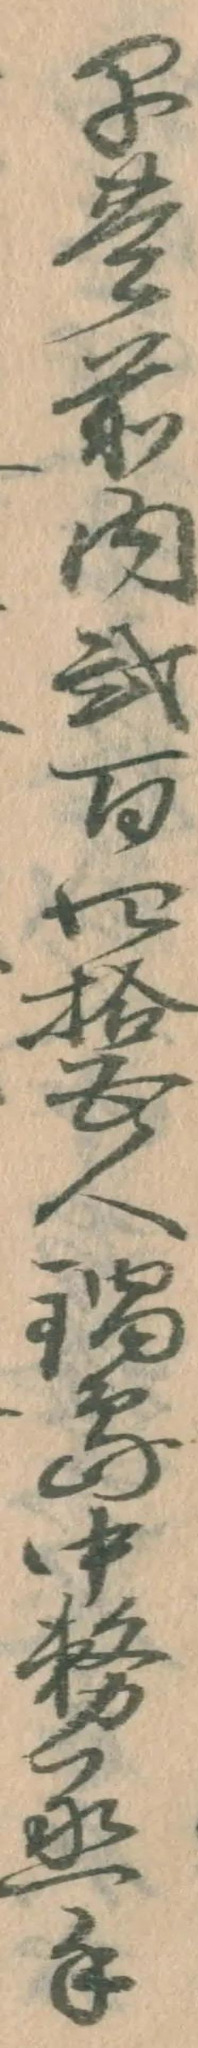早豊前内弐百四拾五人鍋島中務丞手
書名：切支丹御退治記 49巻. [5]
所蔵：国立国会図書館 National Diet Library, JAPAN
